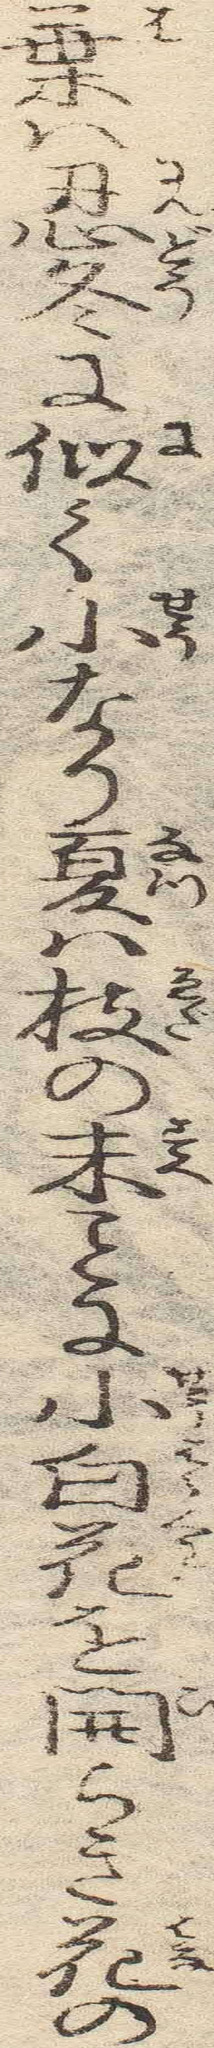葉は忍冬に似て小なり夏は枝の末ことに小白花を開らき花の
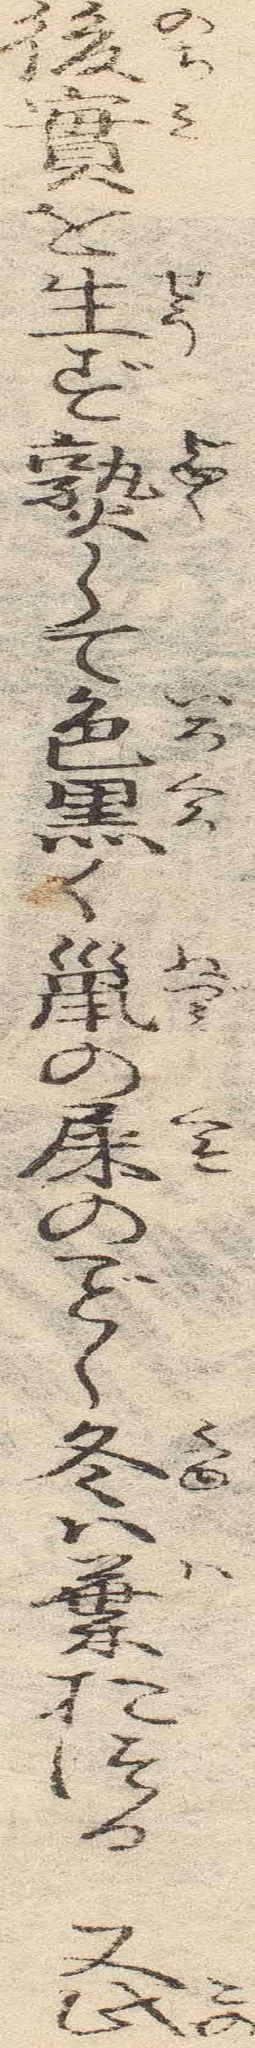後実を生ず熟して色黒く鼠の屎のごとし冬は葉おつる又此
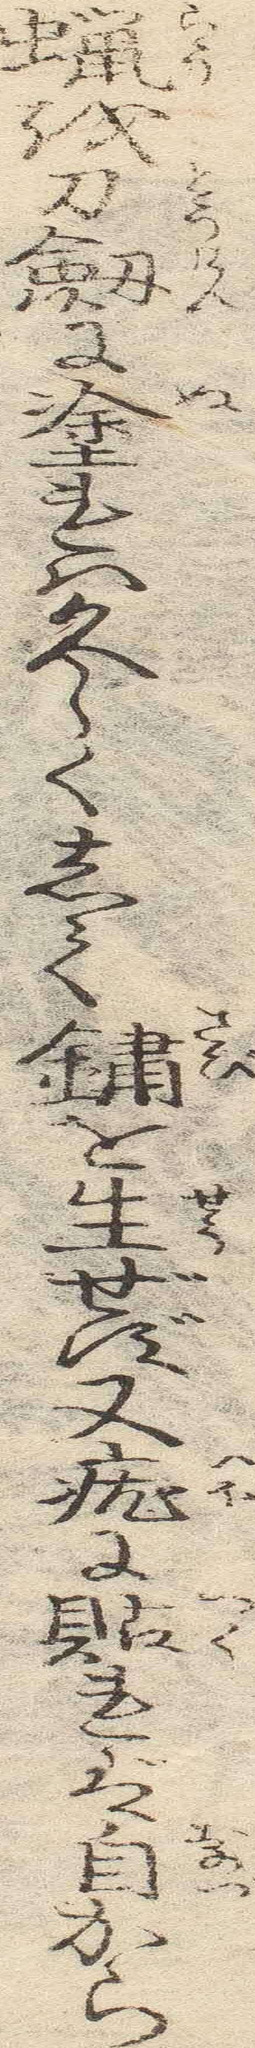蝋を刀剣に塗れは久しくして鏽を生ぜず又疣に貼れば自から
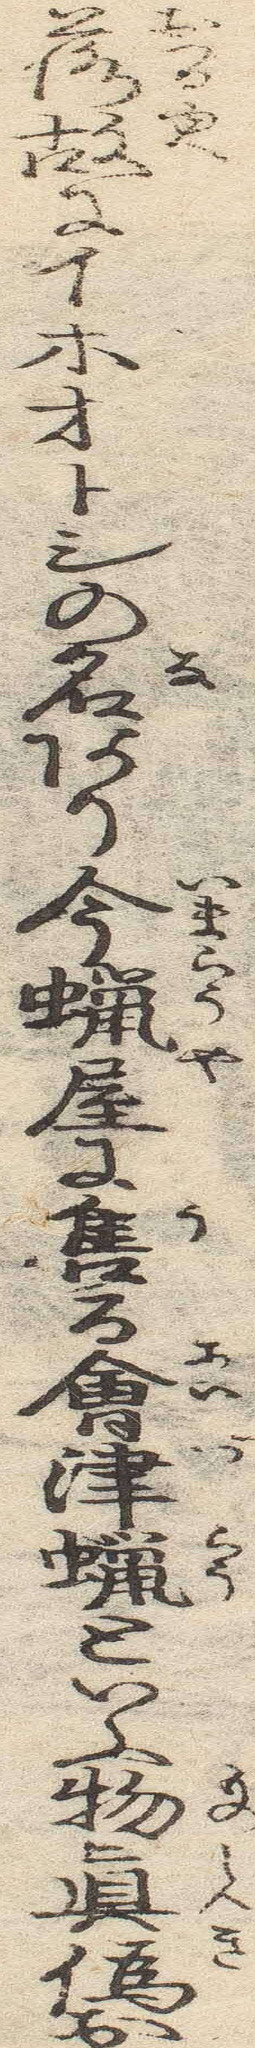落故にイホオトシの名あり今蝋屋に售る会津蝋といふ物真偽お
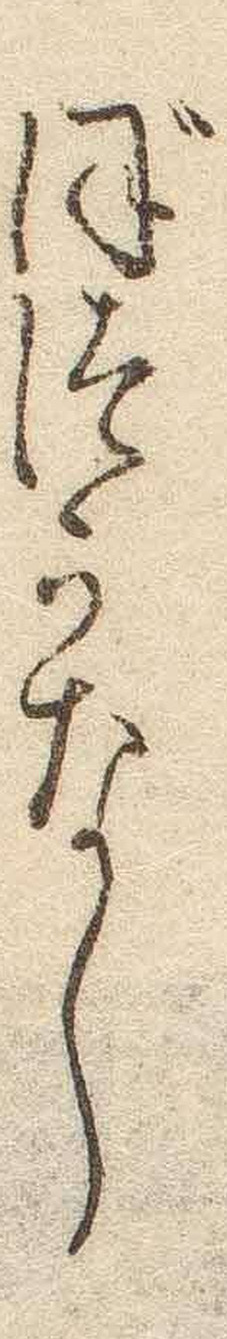ぼつかなし
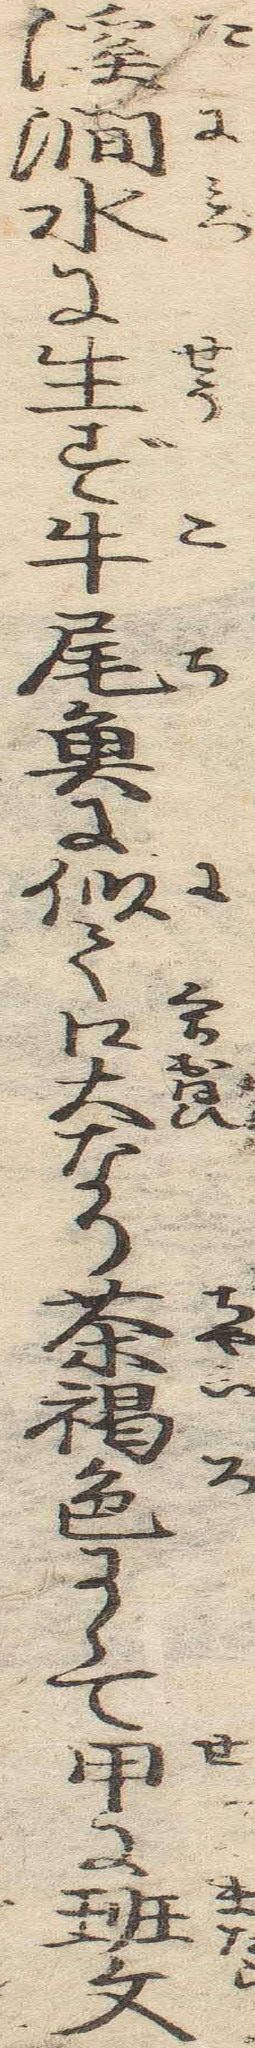渓澗水に生ず牛尾魚に似て口大なり茶褐色にして甲に班文
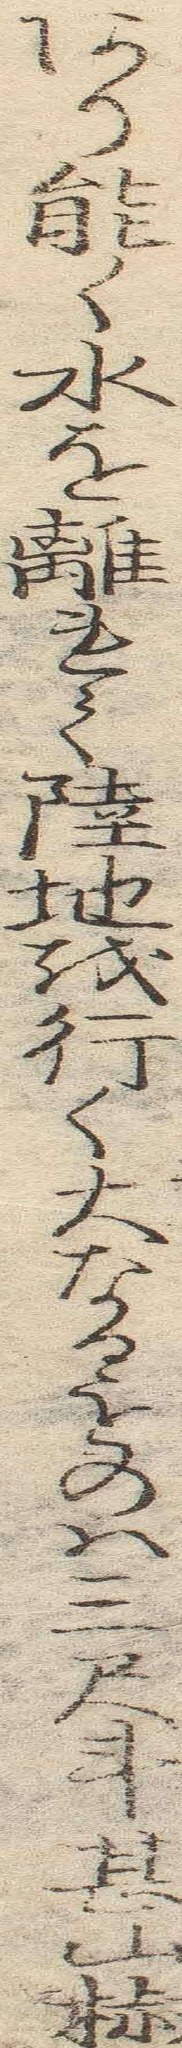あり能く水を離れて陸地を行く大なるものは三尺斗甚山椒
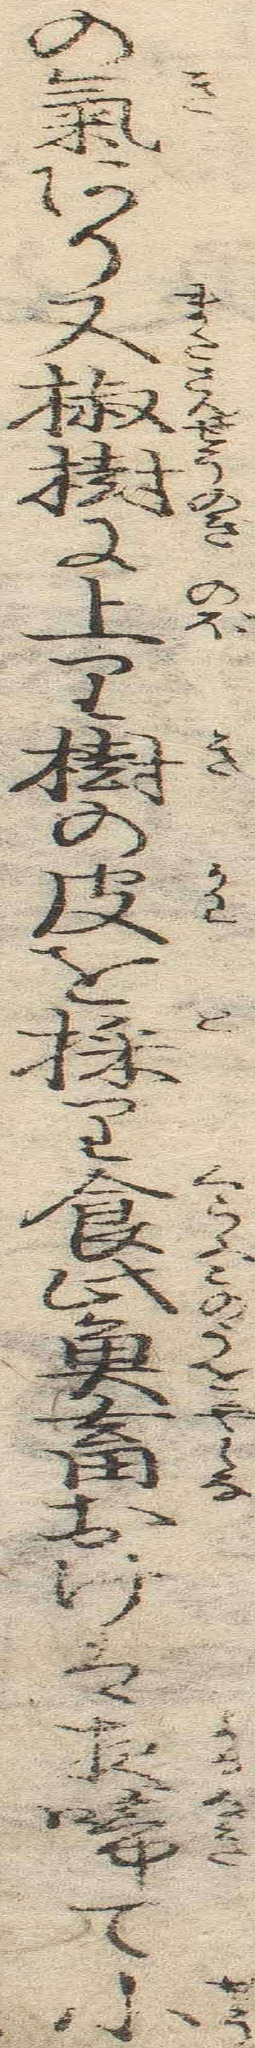の気あり又椒樹に上り樹の皮を採り食此魚畜おけは夜啼て小
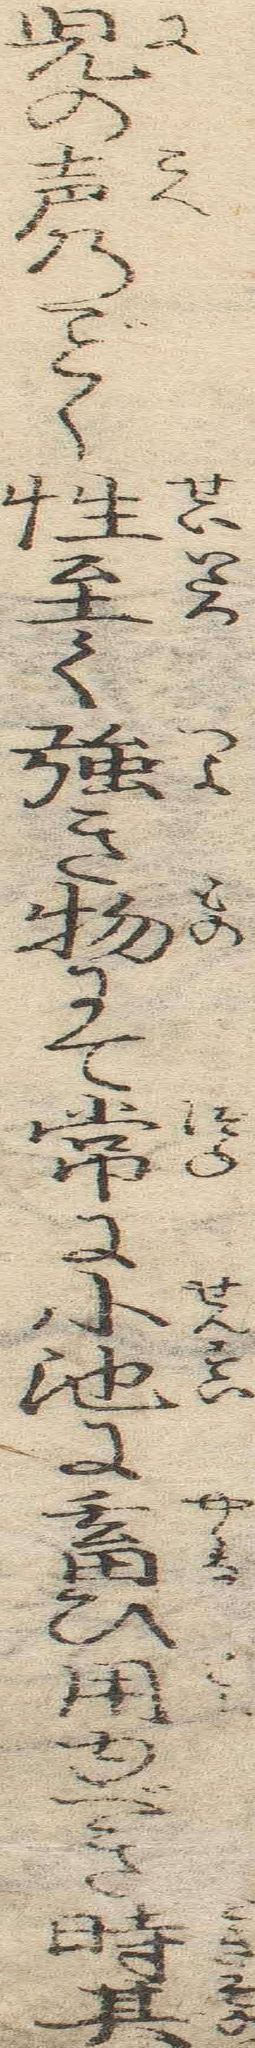児の声のごとく性至て強き物にて常に小池に畜ひ用ゆべき時其
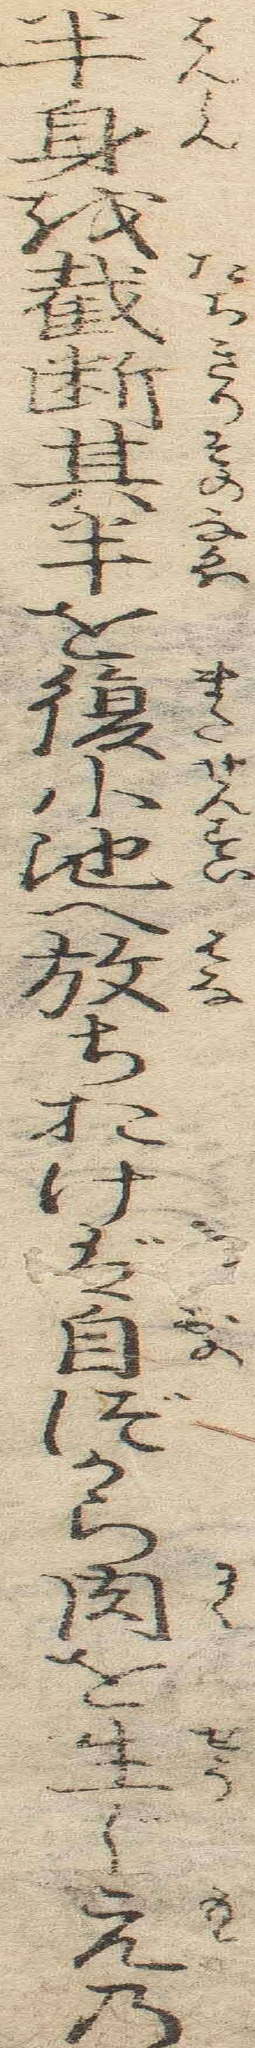半身を截断其半を復小池へ放ちおけば自づから肉を生じ元の
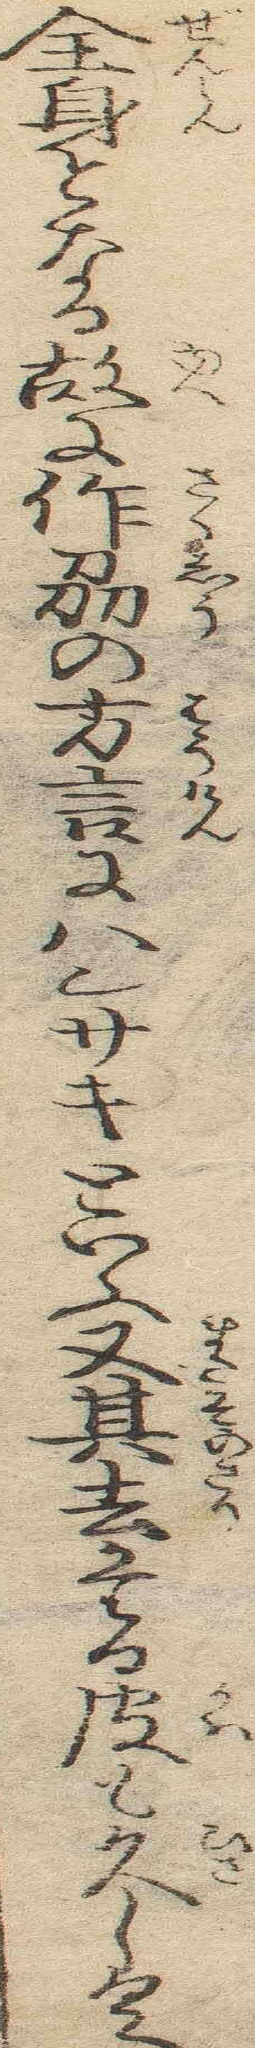全身となる故に作州の方言にハンサキといふ又其去たる皮も久しく

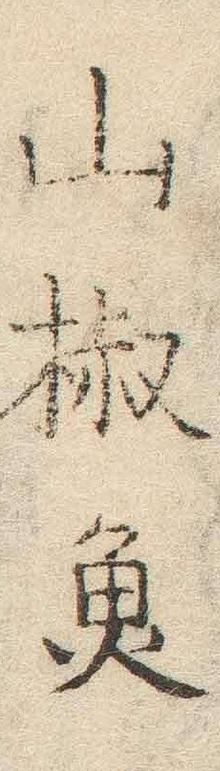山椒魚

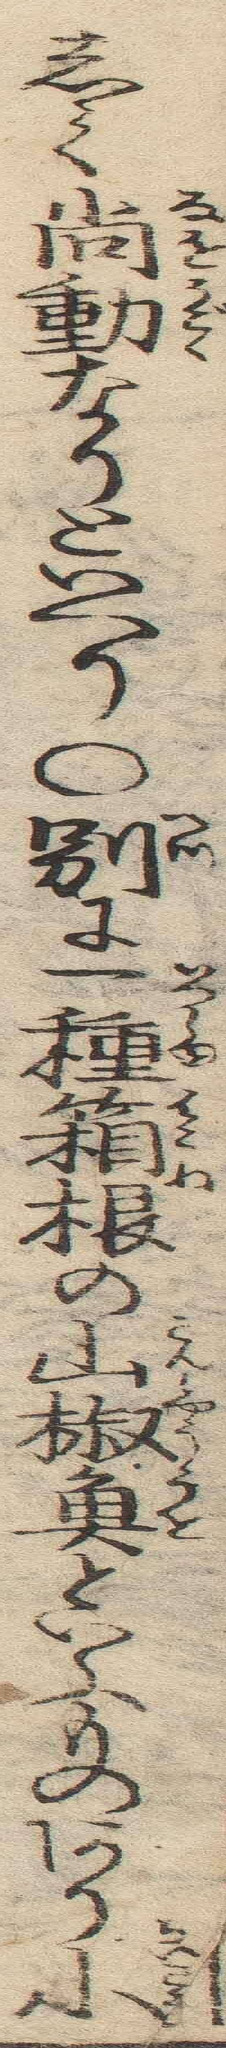して尚動なりといへり○別に一種箱根の山椒魚といふものあり小
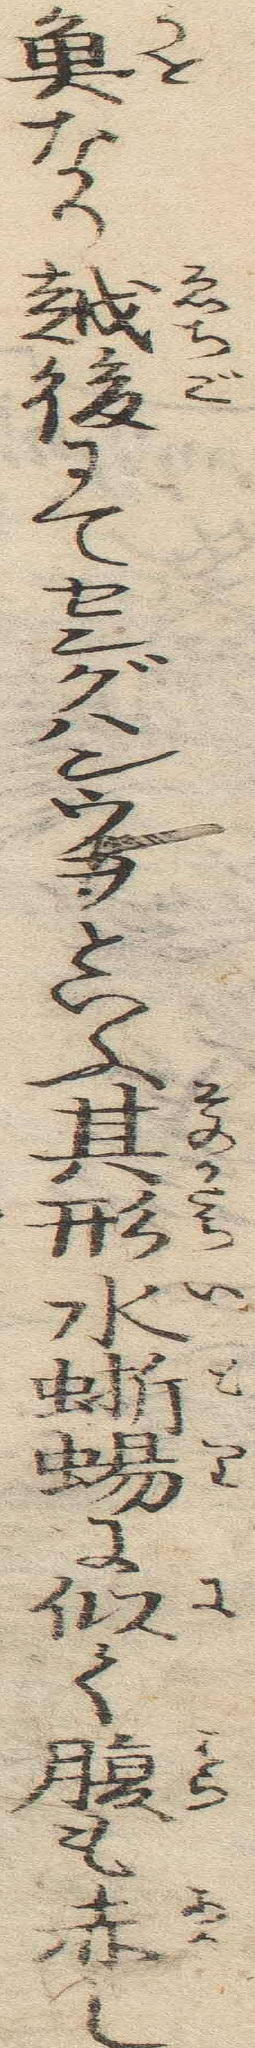魚なり越後にてセングハンウヲといふ其形水蜥蜴に似て腹も赤し
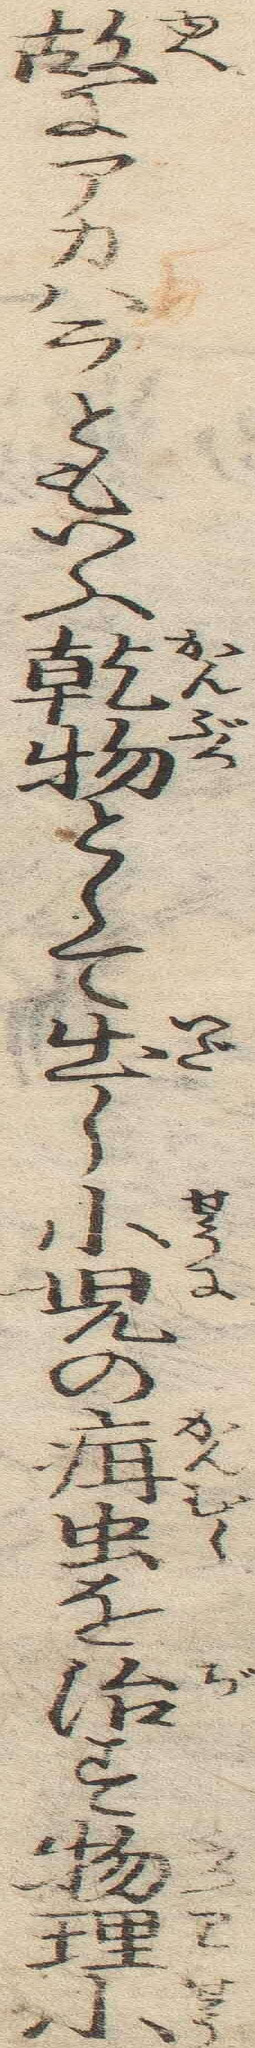故にアカハラともいふ乾物として出し小児の疳虫を治す物理小
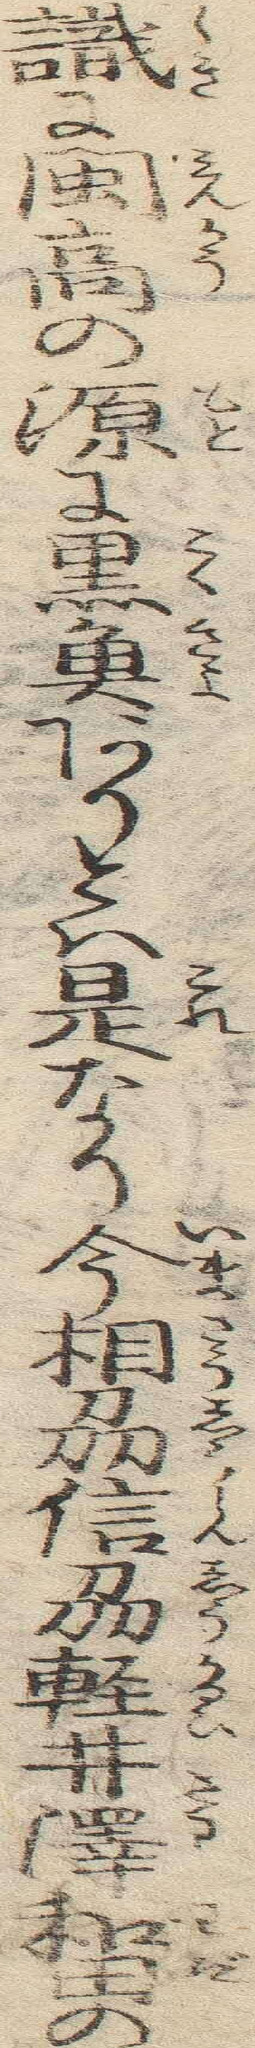識に閩高の源に黒魚ありとは是なり今相州信州軽井沢和田の
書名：日本山海名産図会
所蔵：東京学芸大学附属図書館 国文学研究資料館
